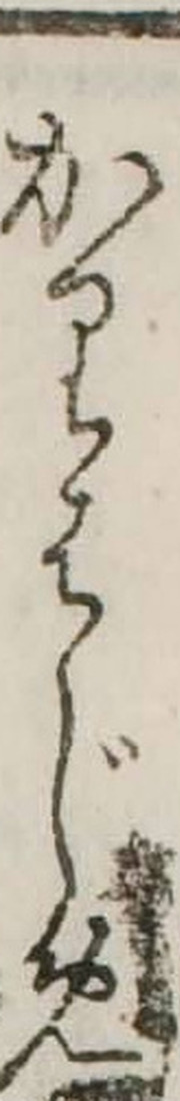かりはじめ
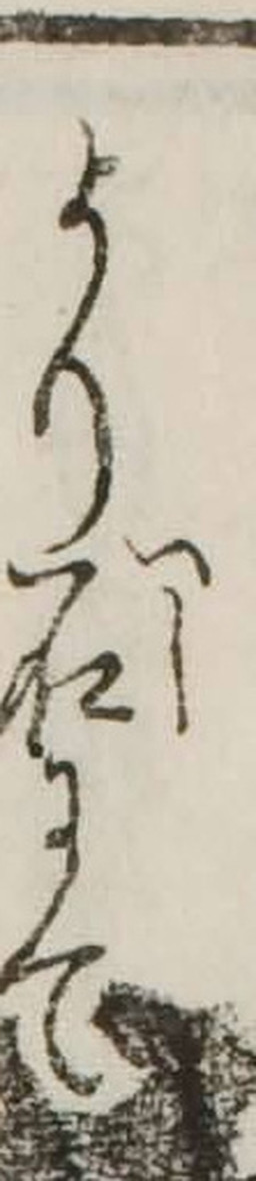より石にて
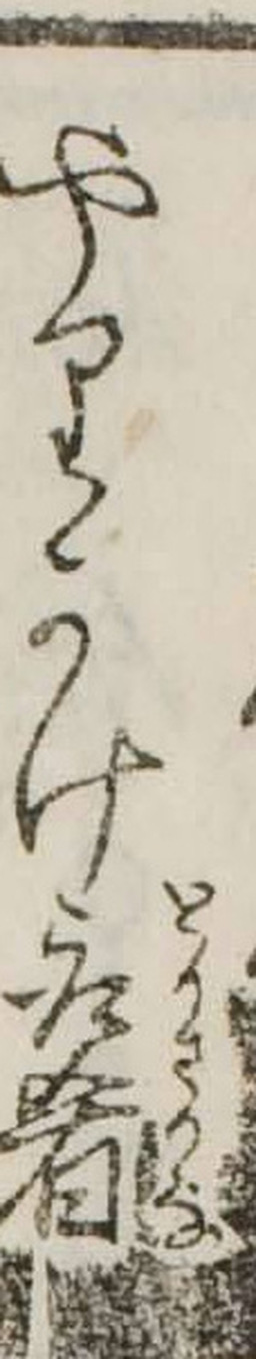やりかけ取肴
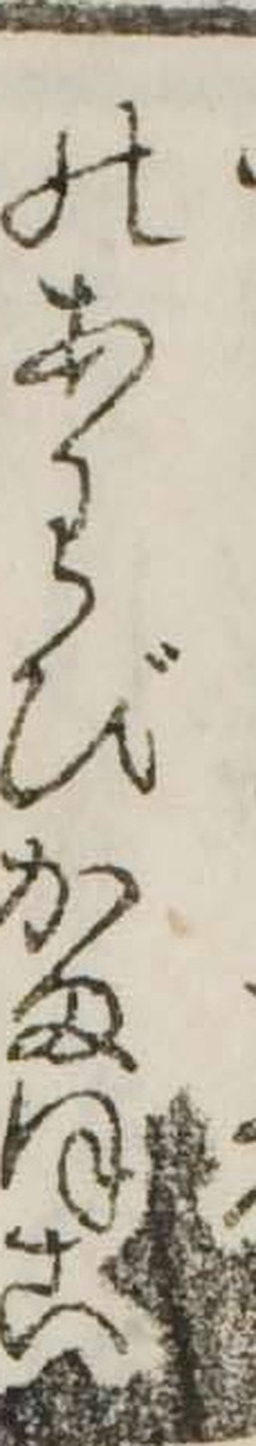のあわびかまほこ
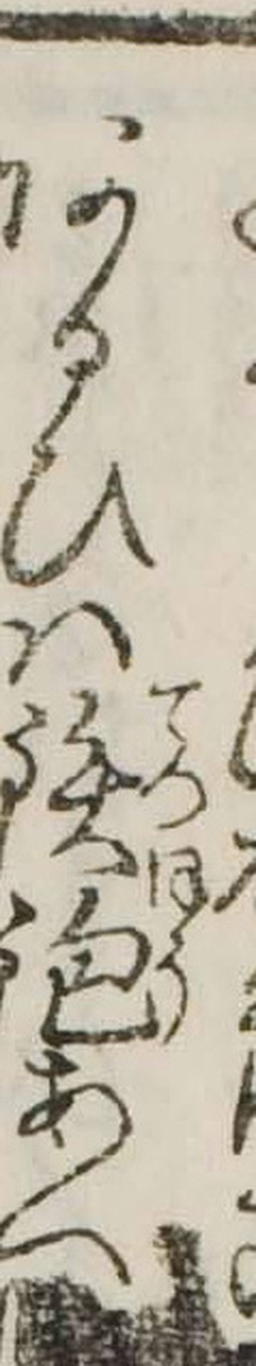あるひは鉄炮あへ
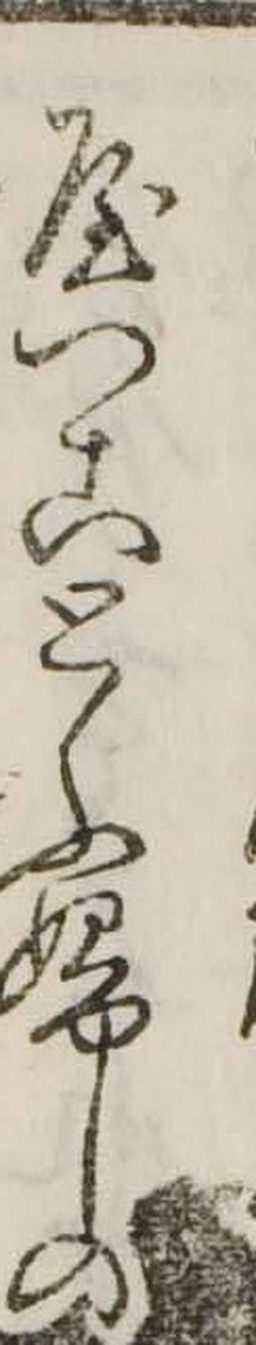やつことふふの
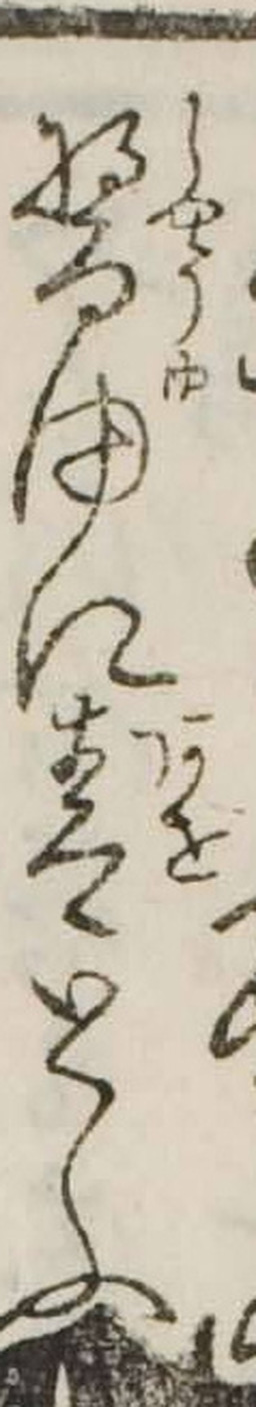醤油に青とふ
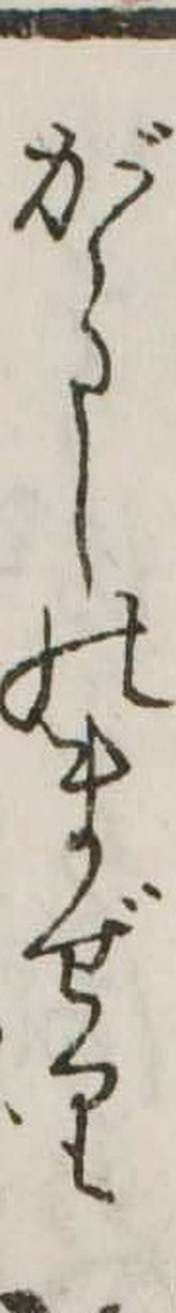がらしのまぜり
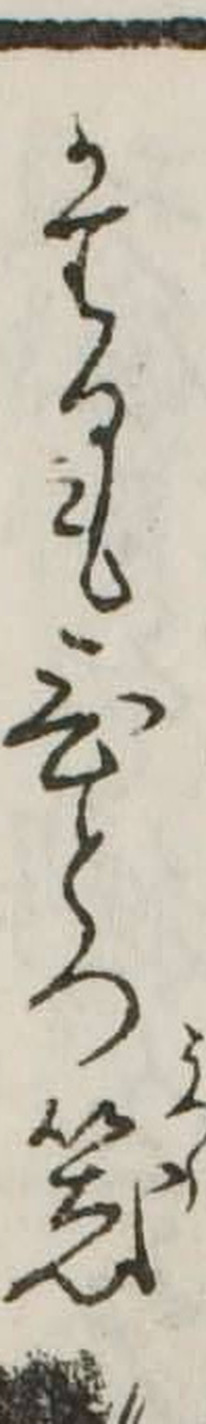たるもひとつ器
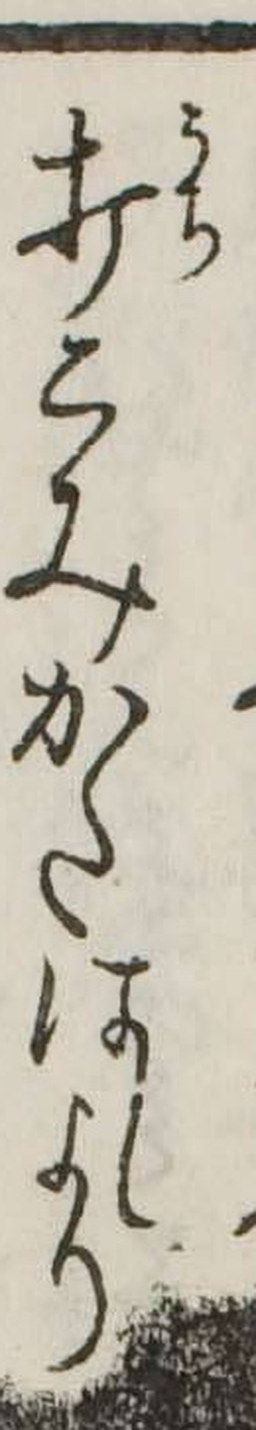打こみかたはしより
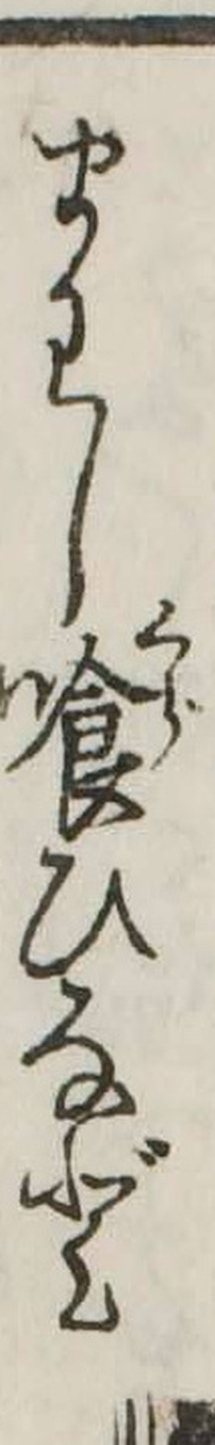まわし喰ひなど
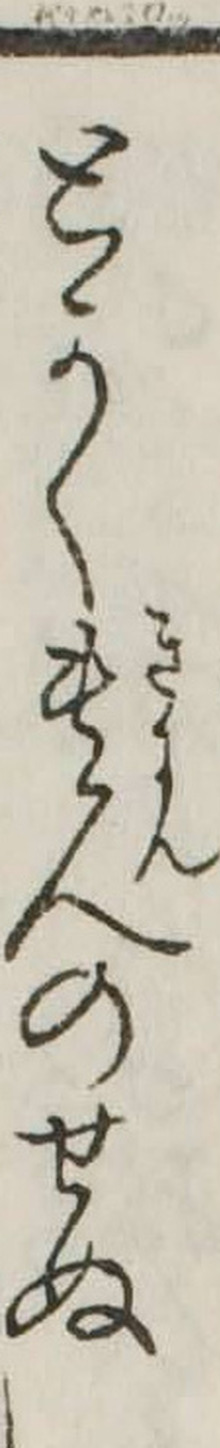とかく貴人のせぬ
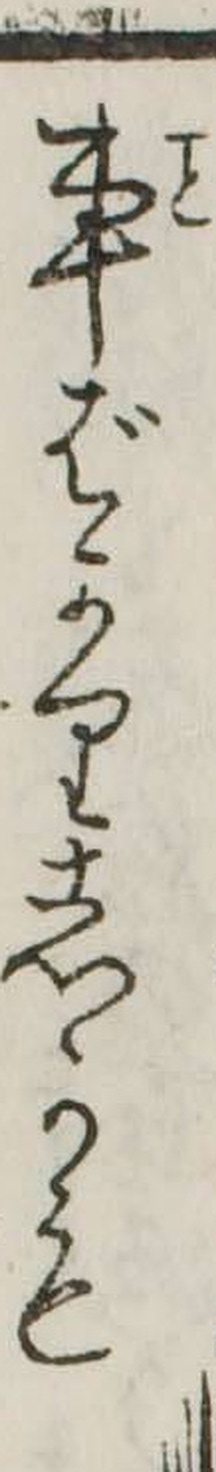事ばかりしかも
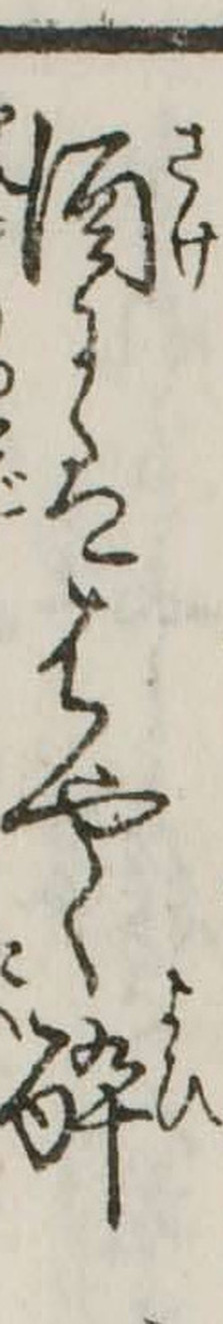酒にははやく酔
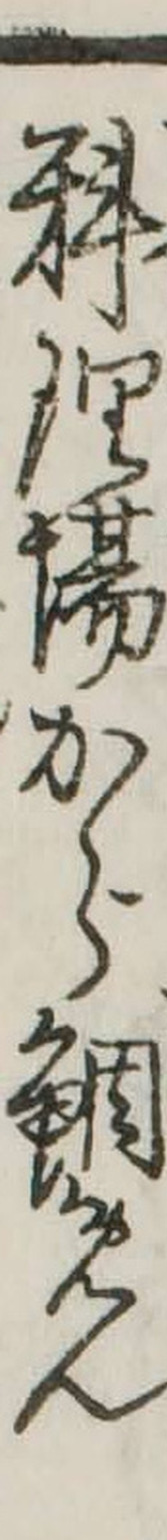料理場から鯛めん
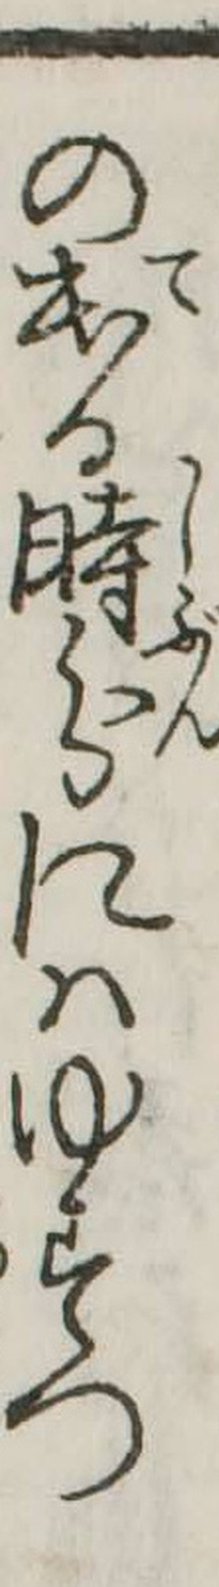の出る時分にはゆすつ
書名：繪本不盡泉
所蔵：国文学研究資料館
